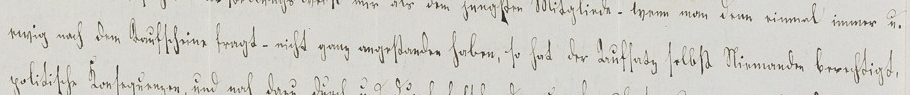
ewig nach dem Taufscheine fragt – nicht ganz angestanden haben, so hat der Aufsatz selbst Niemanden berechtigt,
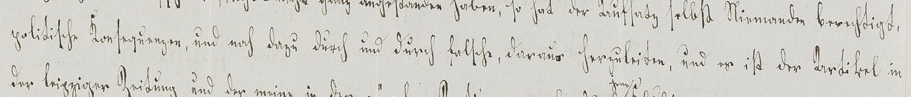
politische Konsequenzen, und noch dazu durch und durch falsche, daraus herzuleiten, und es ist der Artikel in
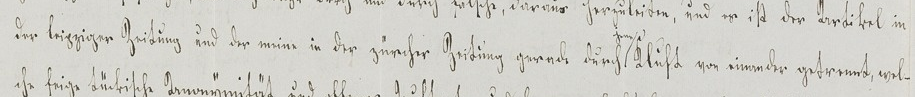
der leipziger Zeitung und der meine in der zürcher Zeitung gerade durch jene Kluft von einander getrennt, wel-
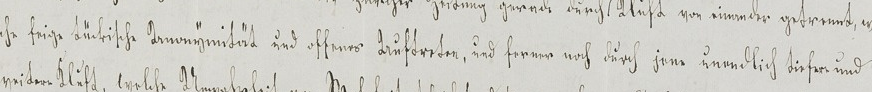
che feige tückische Anonymität und offenes Auftreten, und ferner noch durch jene unendlich tiefere und
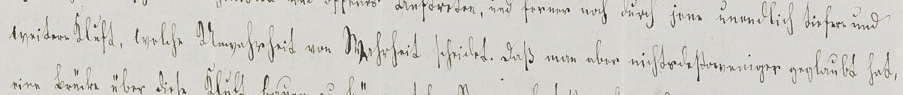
weitere Kluft, welch Unwahrheit von Wahrheit scheidet. Daß man aber nichtsdestoweniger geglaubt hat,
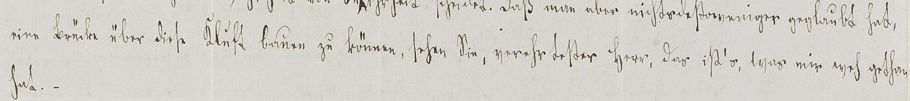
eine Brücke über diese Kluft bauen zu können, sehen Sie, verehrtester Herr, das ist's, was mir weh gethan
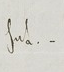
hat. –
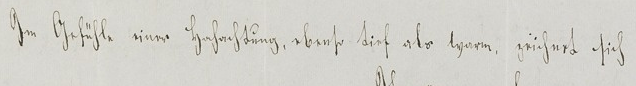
Im Gefühle einer Hochachtung, ebenso tief als warm, zeichnet sich
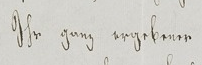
Ihr ganz ergebener
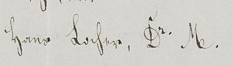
Hans Locher, Dr Me.
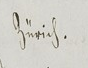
Zürich.
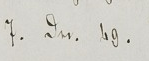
7. Dec. 49.
